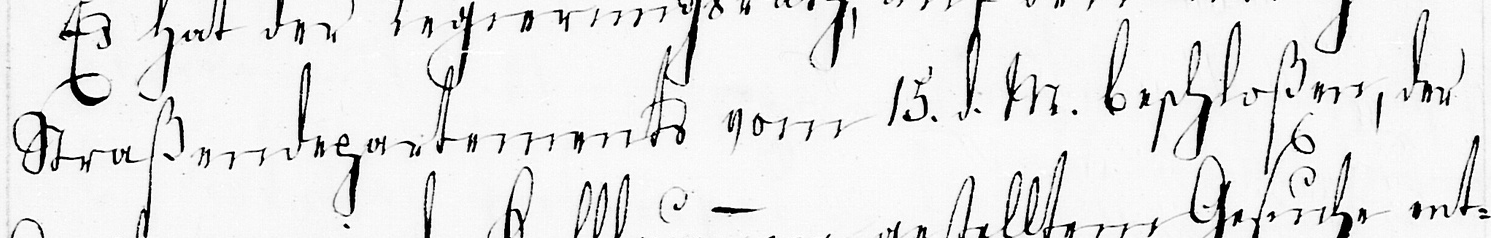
Straßendepartements vom 15. d. M. beschloßen, der
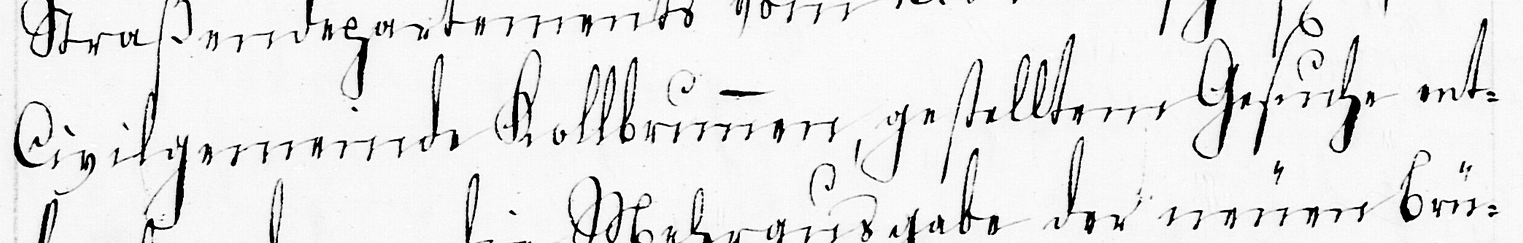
Civilgemeinde Kollbrunnen, gestelltem Gesuche ent¬
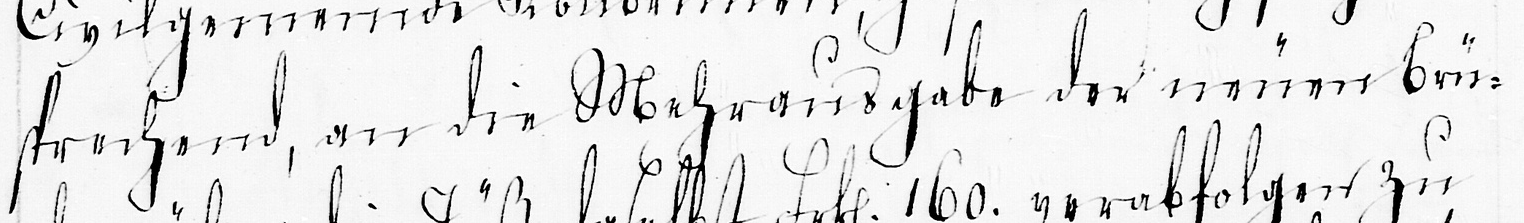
sprechend, an die Mehrausgabe der neuen Brü¬
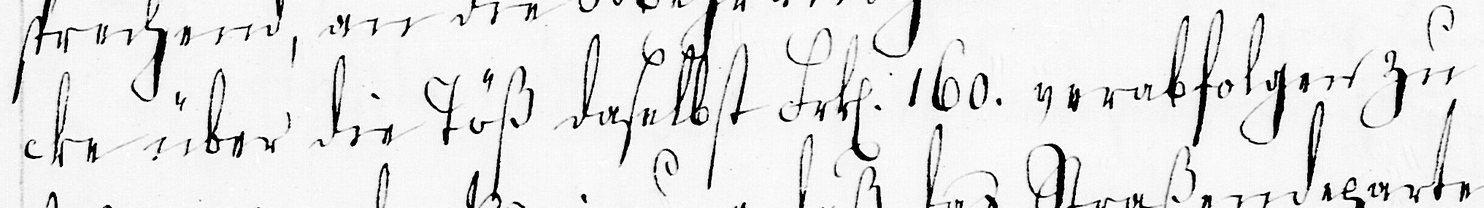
cke über die Töß daselbst Frk[en]. 160. verabfolgen zu
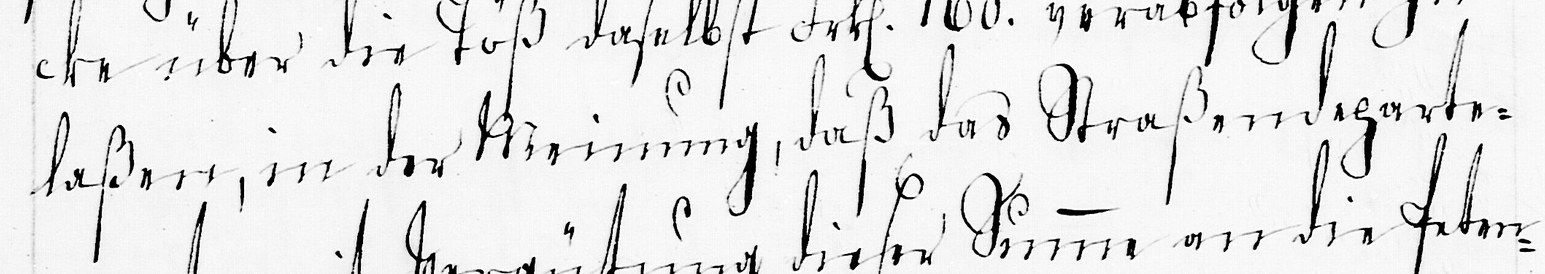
laßen, in der Meinung, daß das Straßendeparte¬
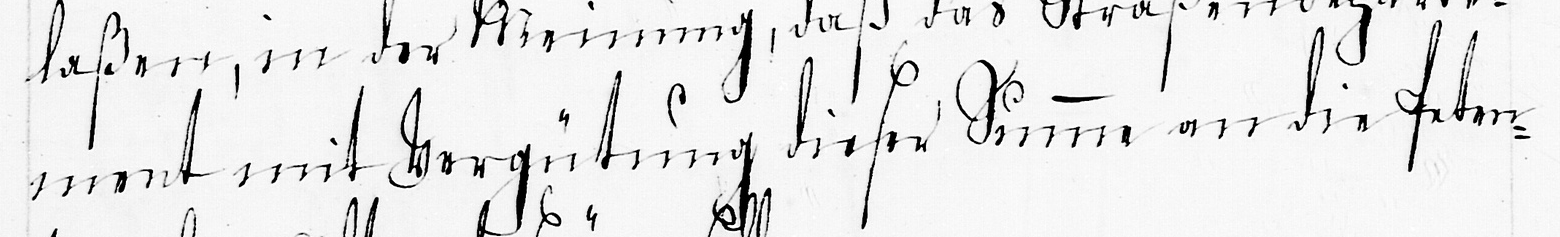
ment mit Vergütung dieser Summe an die Pete¬
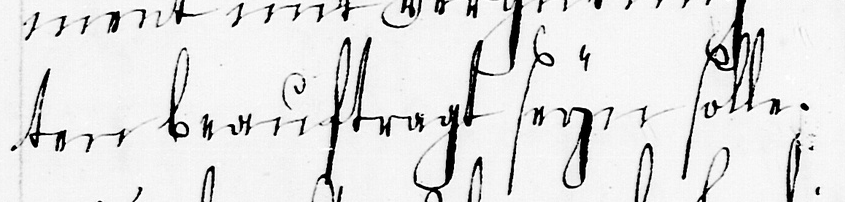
nten beauftragt seyn solle.
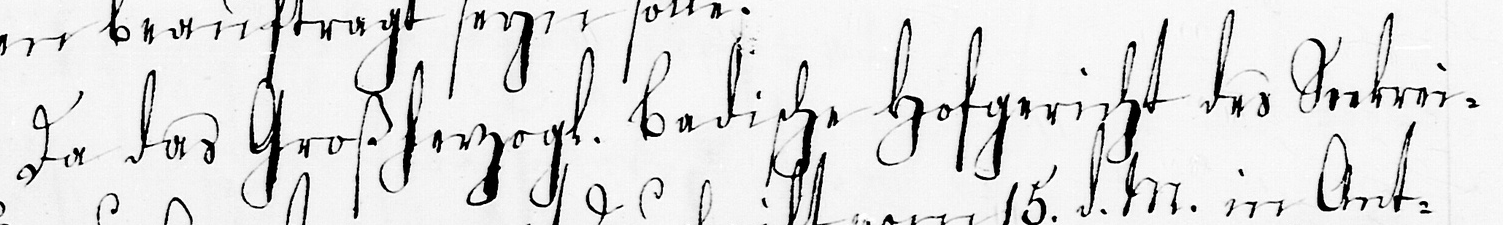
Da das Großherzogl. Badische Hofgericht des Seekrei¬
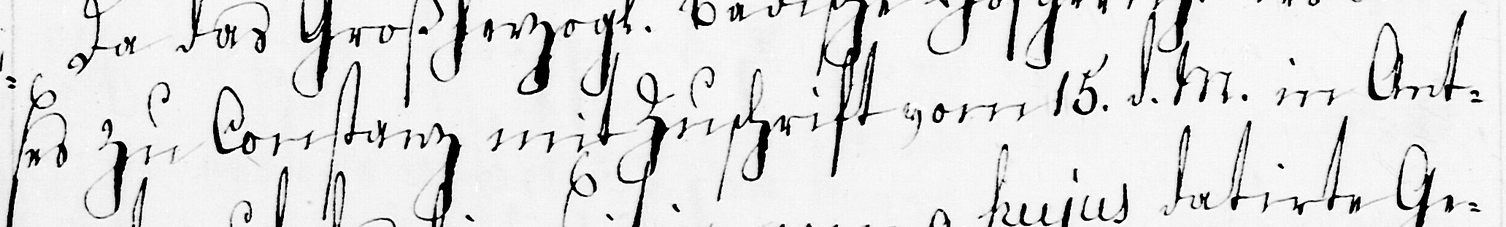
ses zu Constanz mit Zuschrift vom 15. d. M. in Ant¬
